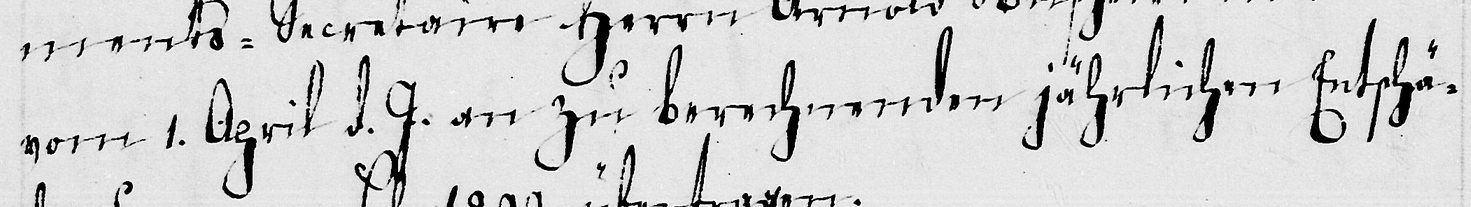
vom 1. April d. J. an zu berechnenden jährlichen Entschä¬
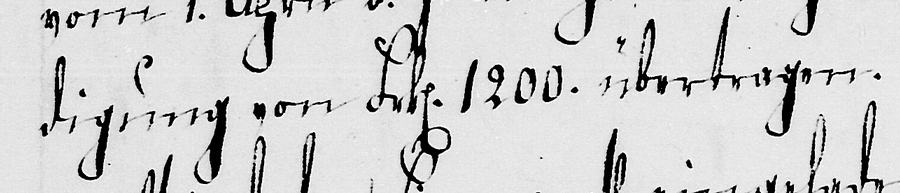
digung von Frk[en] 1200. übertragen.
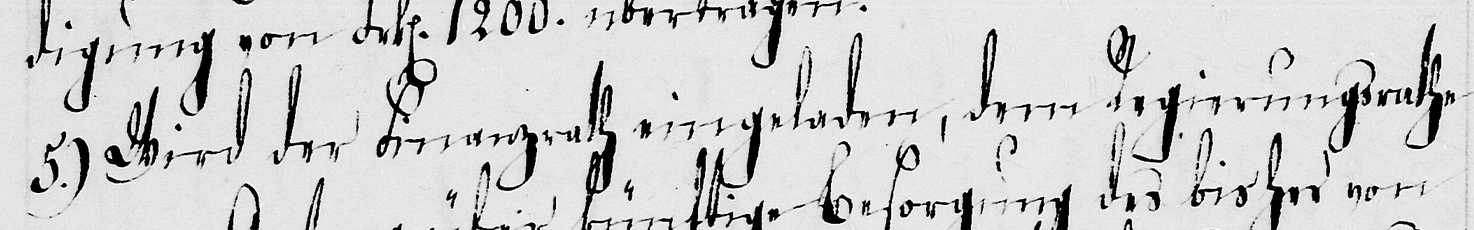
5.) Wird der Finanzrath eingeladen, dem Regierungsrathe
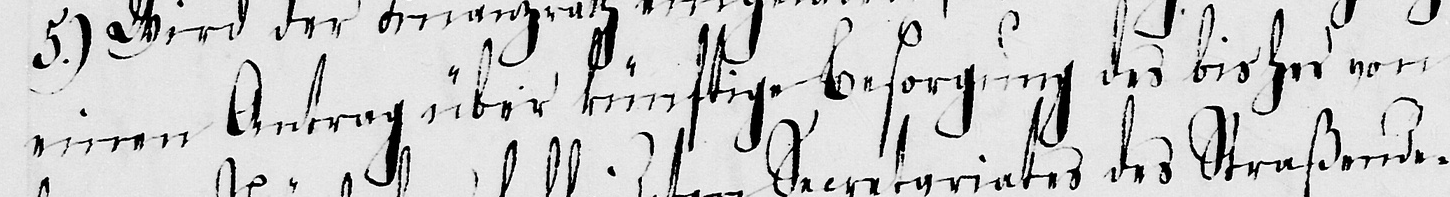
einen Antrag über künftige Besorgung des bisher von
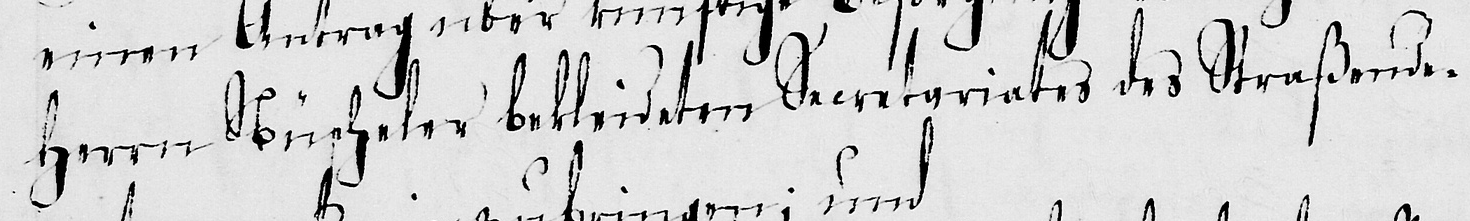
Herrn Nüscheler bekleideten Secretariates des Straßende¬
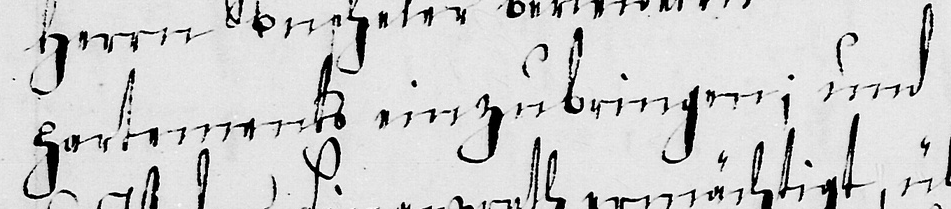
partements einzubringen; und
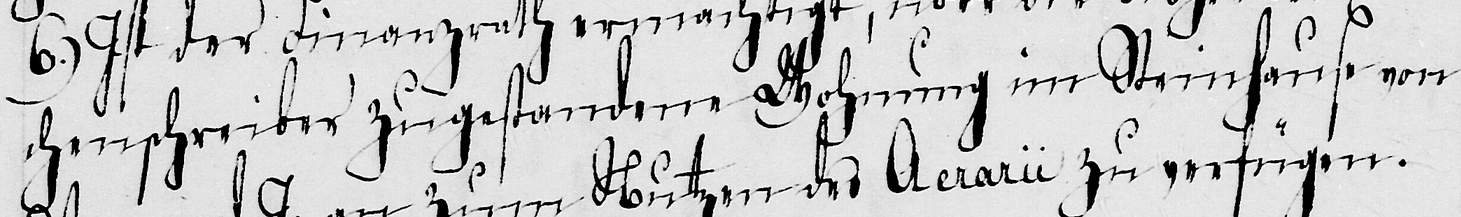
chenschreiber zugestandene Wohnung im Steinhause von
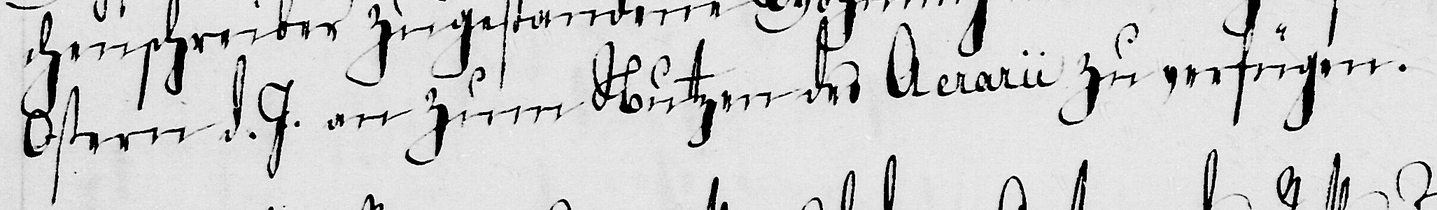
Ostern d. J. an zum Nutzen des Aerarii zu verfügen.
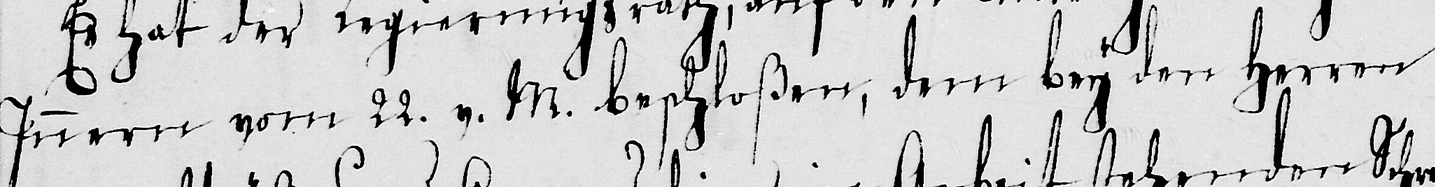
Innern vom 22 v. M. beschloßen, dem bey den Herrn
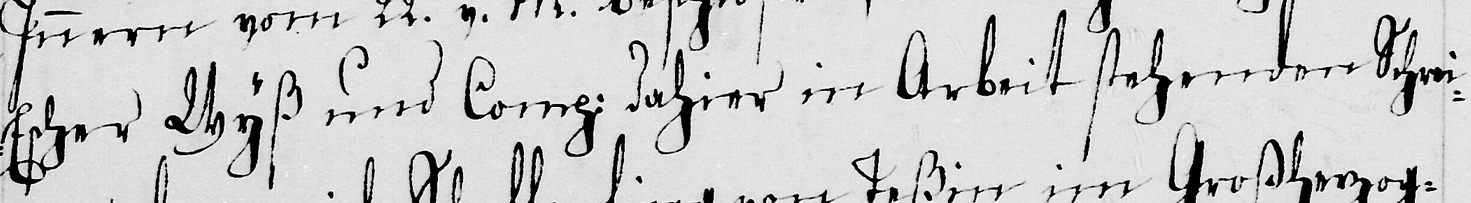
Escher Wyß und Comp: dahier in Arbeit stehenden Schre¬
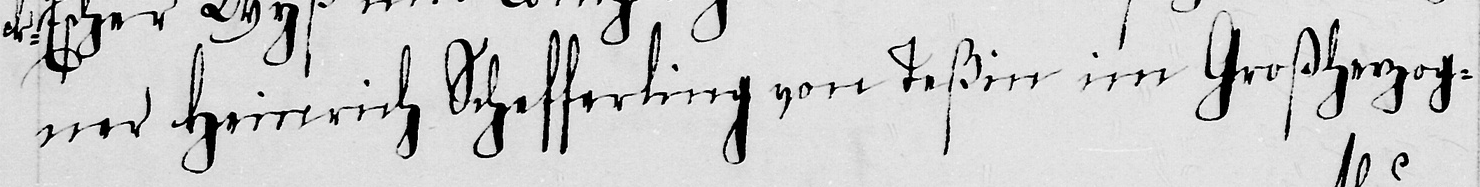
iner Heinrich Schefferling von Teßin im Großherzog-
